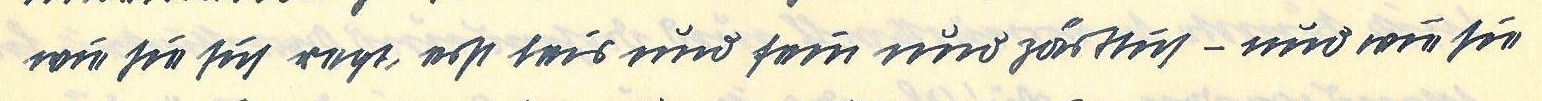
wie sie sich regt, erst leis und fein und zärtlich – und wie sie
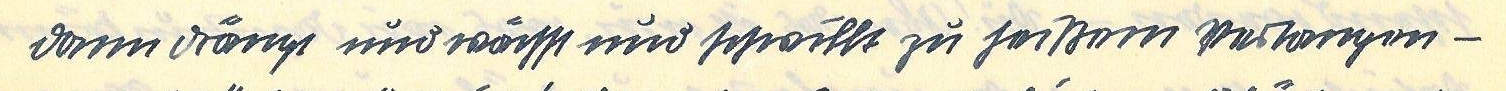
dann drängt und wächst und schwillt zu heißem Verlangen –
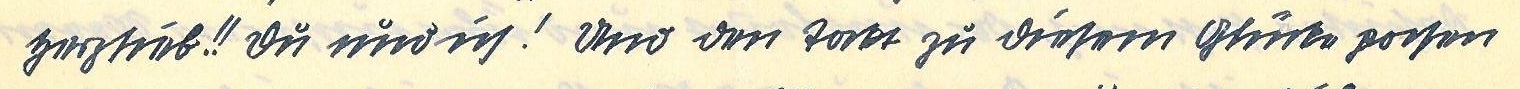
Herzlieb! Du und ich! Und den Takt zu diesem Glücke pochen
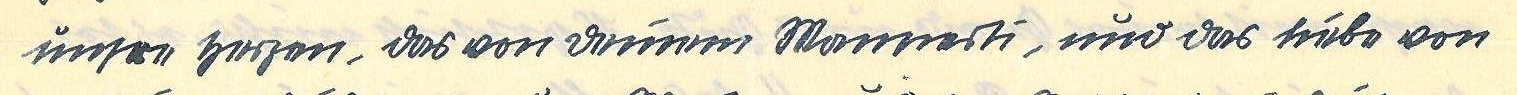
unsre Herzen, das von Deinem Mannerli, und das liebe von
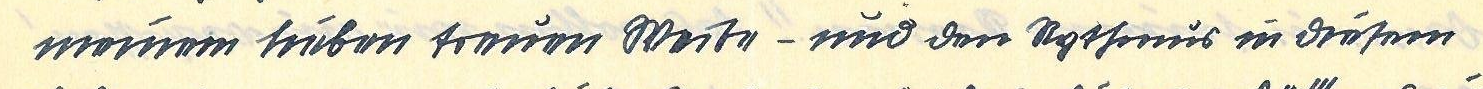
meinem lieben treuen Weibe – und den Rythmus in diesem
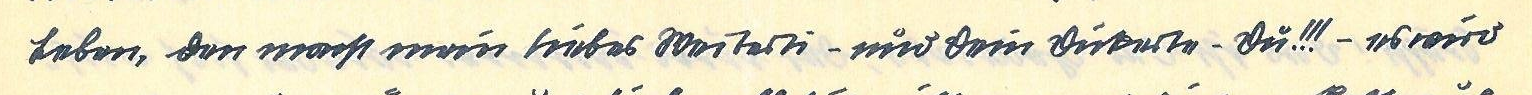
Leben, den macht mein liebes Weiberli – und Dein Dickerle – Du!!! – es wird
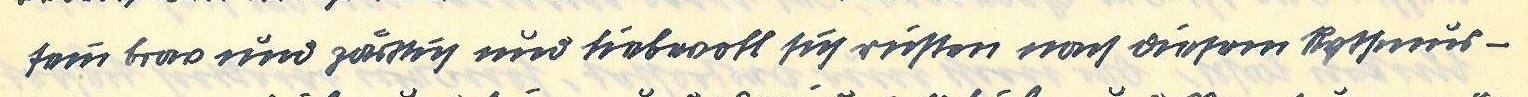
fein brav und zärtlich und liebevoll sich richten nach diesem Rythmus –
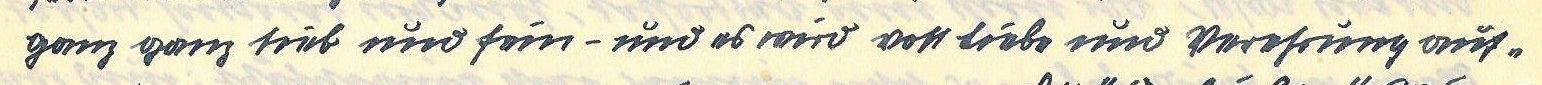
ganz ganz lieb und fein – und es wird voll Liebe und Verehrung auf¬
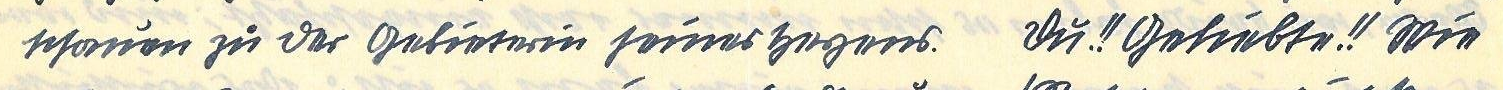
schauen zu der Gebieterin seines Herzens. Du!! Geliebte!! Wie
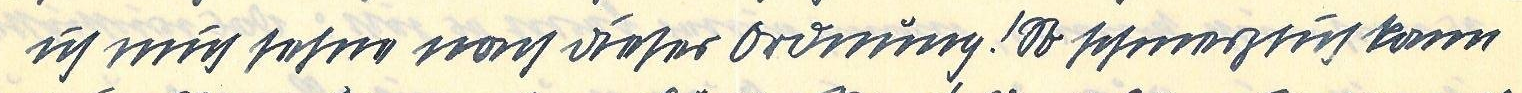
ich mich sehne nach dieser Ordnung! So schmerzlich kann
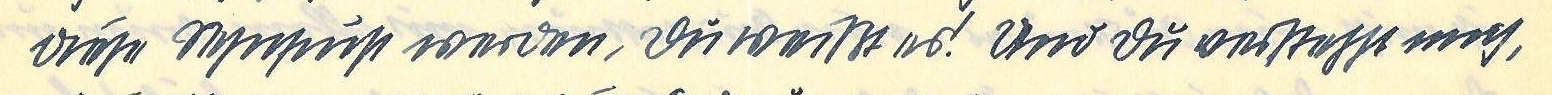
diese Sehnsucht werden, Du weißt es! Und Du verstehst mich,
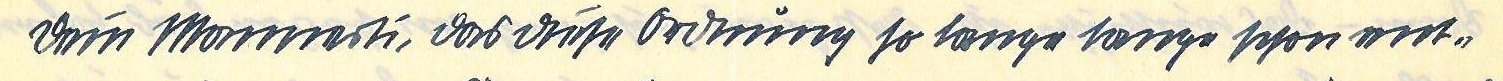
Dein Mannerli, das diese Ordnung so lange lange schon ent¬
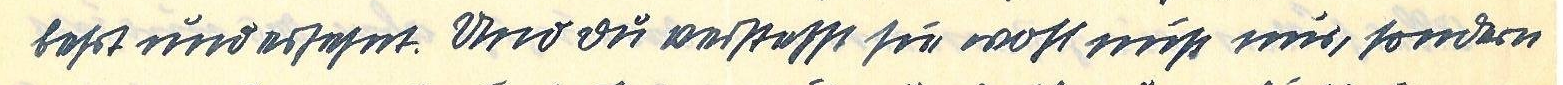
behrt und ersehnt. Und Du verstehst sie wohl nicht nur, sondern
